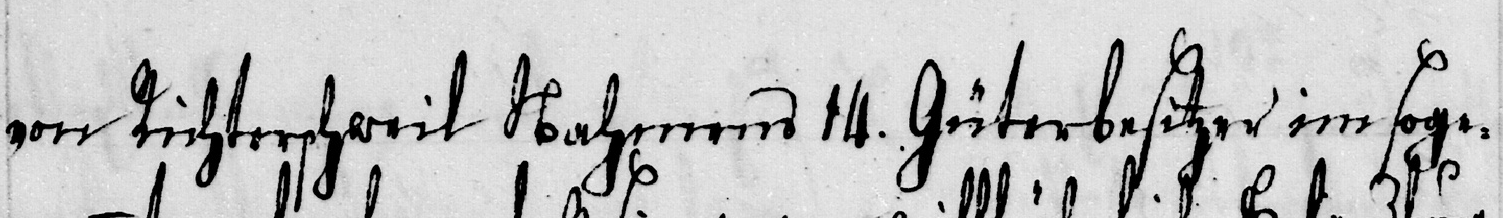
von Richterschweil Nahmens 14. Güterbesitzer im soge¬
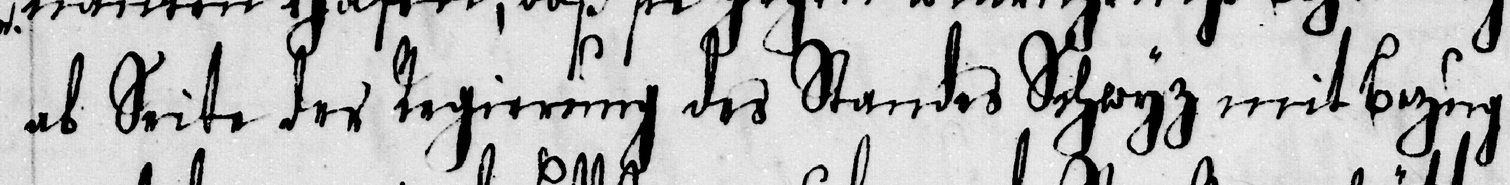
ab Seite der Regierung des Standes Schwyz mit Bezug
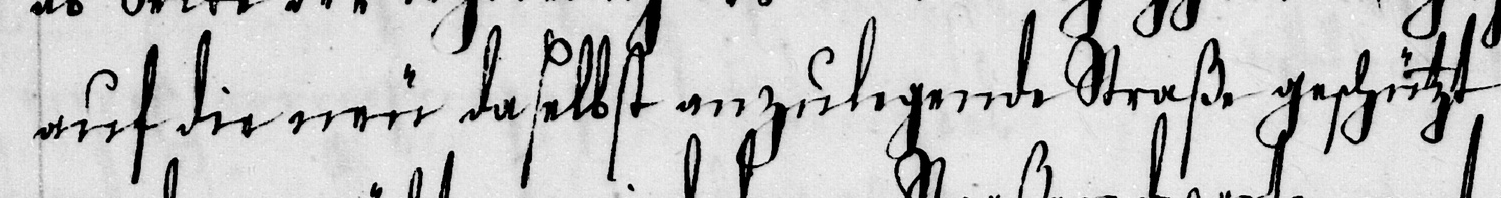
auf die neu daselbst anzulegende Straße geschützt
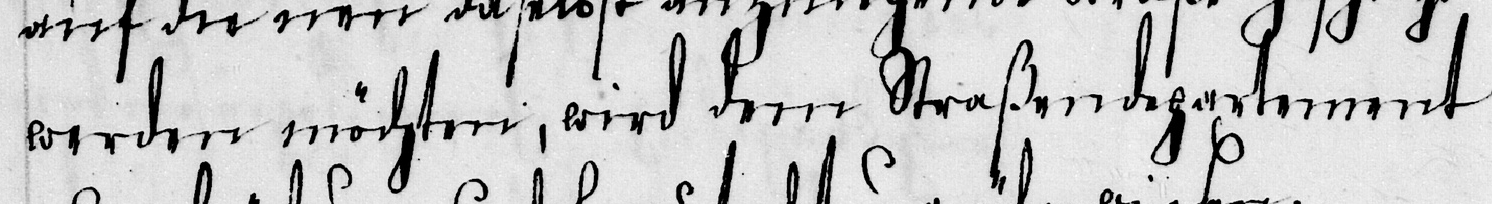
werden möchten, wird dem Straßendepartement
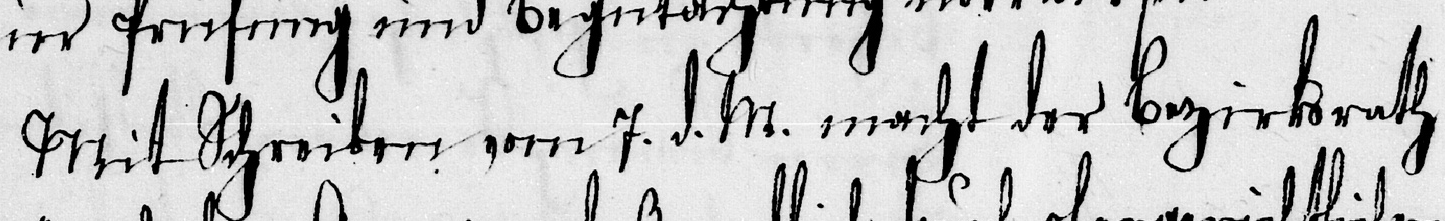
Mit Schreiben vom 7. d. M. macht der Bezirksrath
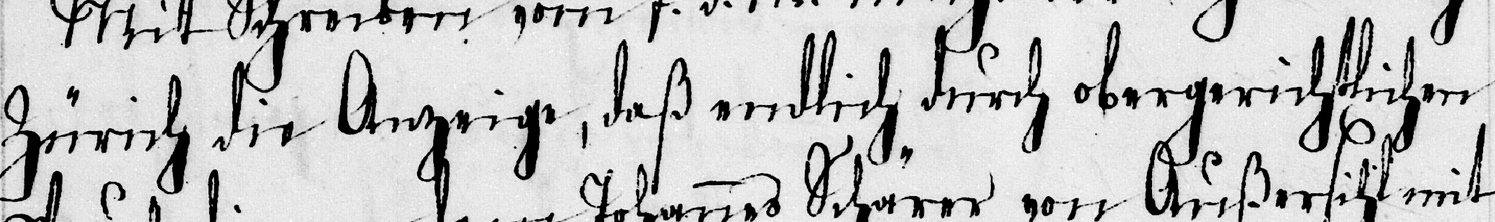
Zürich die Anzeige, daß endlich durch obergerichtlichen
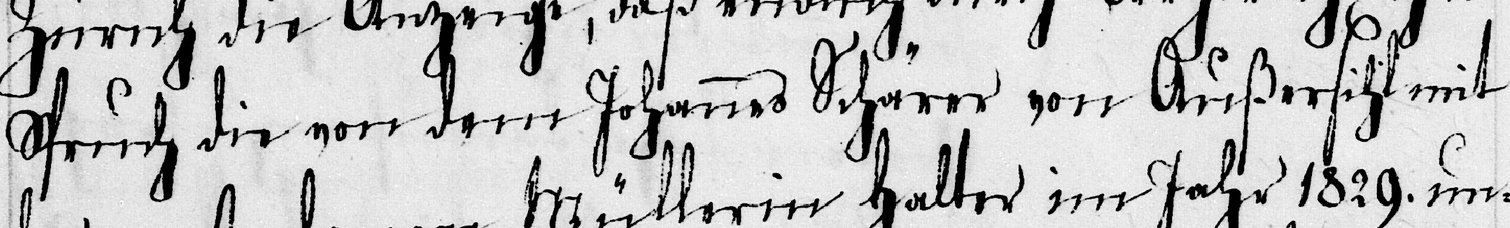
Spruch die von dem Johannes Schärer von Außersihl mit
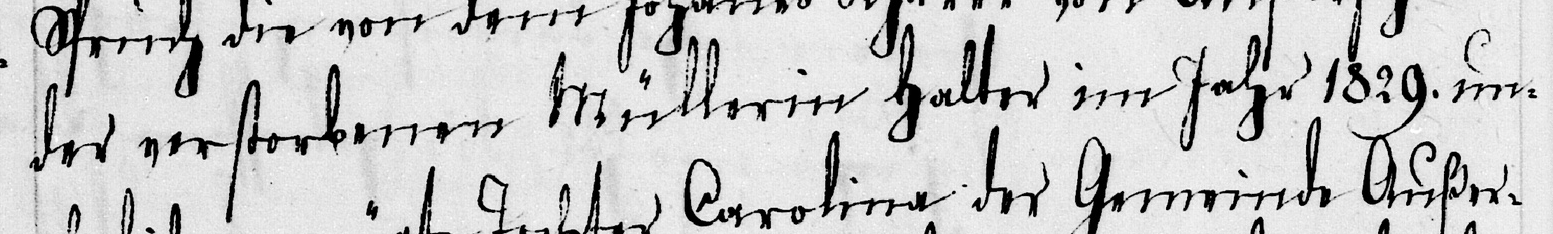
der verstorbenen Müllerin Halter im Jahr 1829. un¬
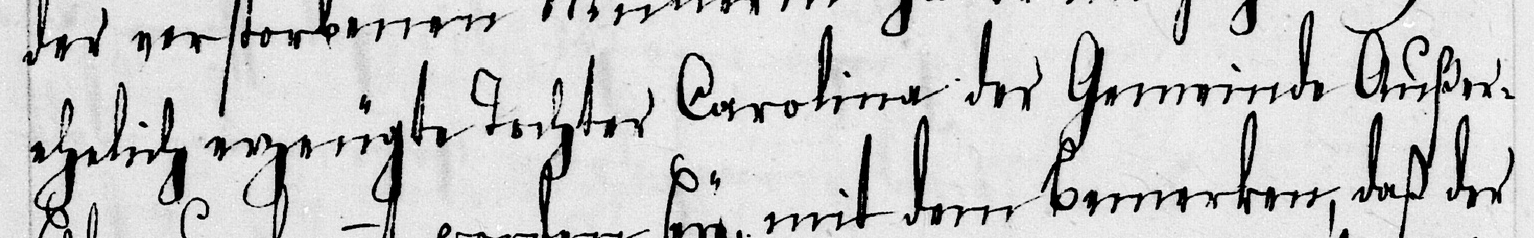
ehelich erzeugte Tochter Carolina der Gemeinde Außer¬
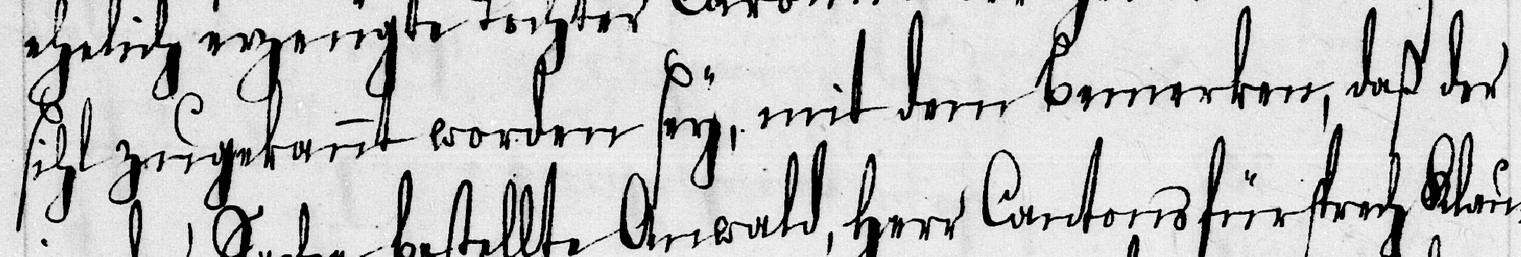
sihl zugekannt worden sey, mit dem Bemerken, daß der
